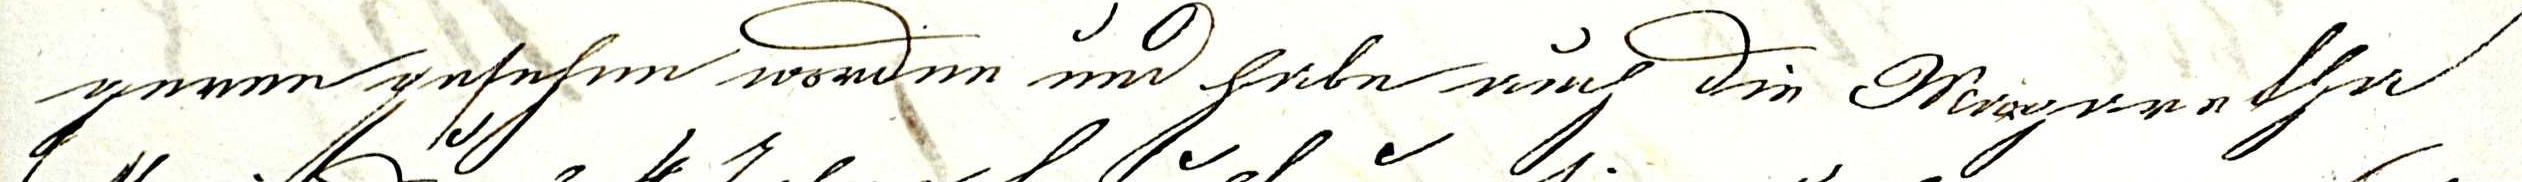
gerne gesehen worden und habe auch die Margaretha
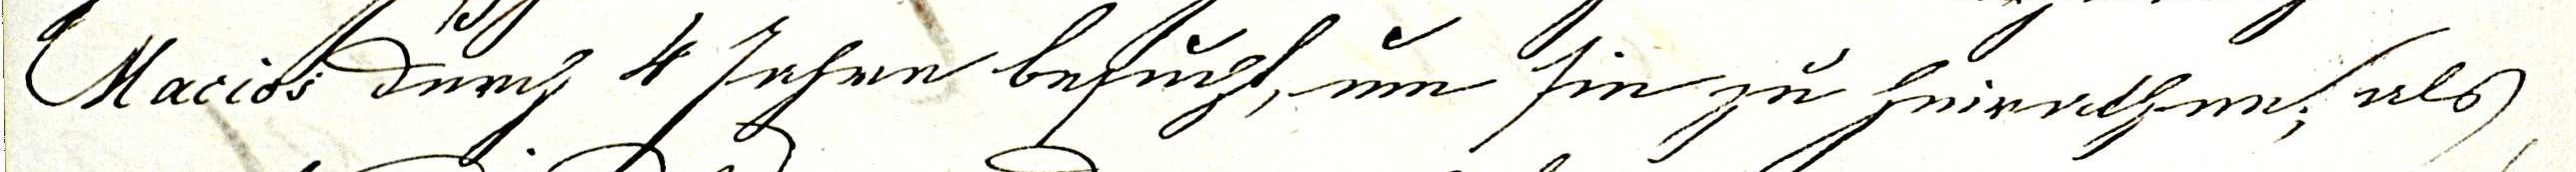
Macios durch 4 Jahre besucht, um sie zu heirathen; als
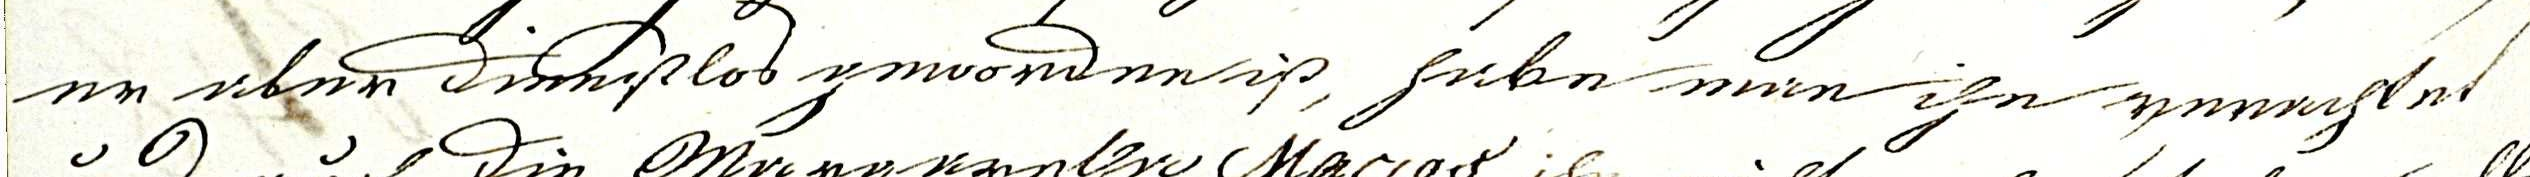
er aber dienstlos geworden ist, habe man ihn verachtet
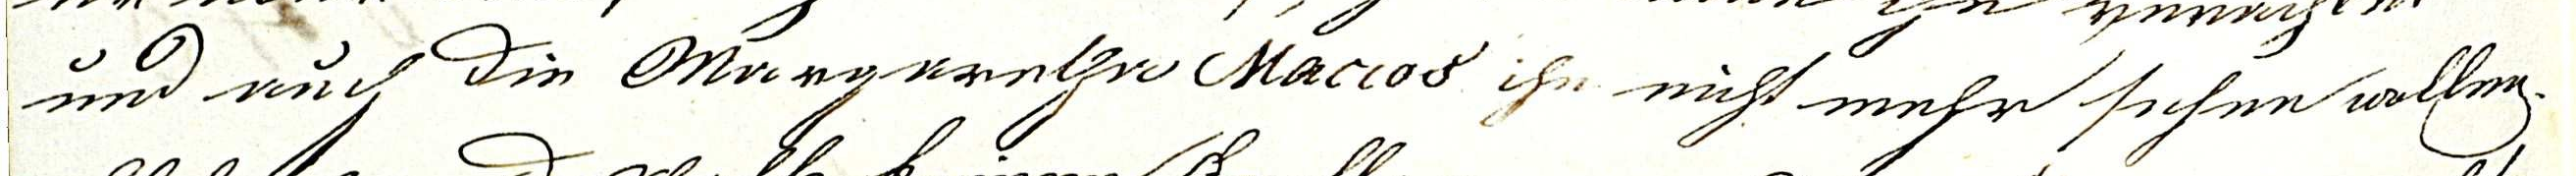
und auch die Margaretha Macios ihn nicht mehr sehen wollen.
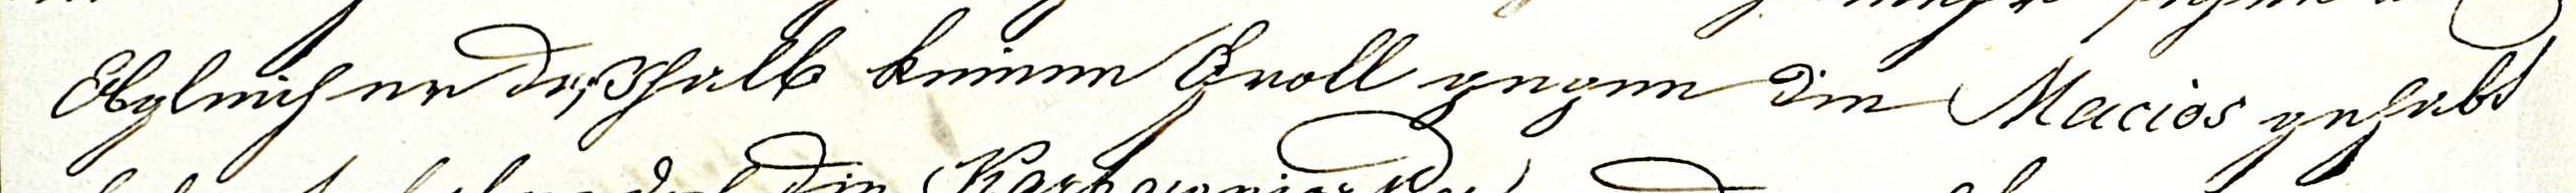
Obgleich er deßhalb keinen Groll gegen die Macios gehabt
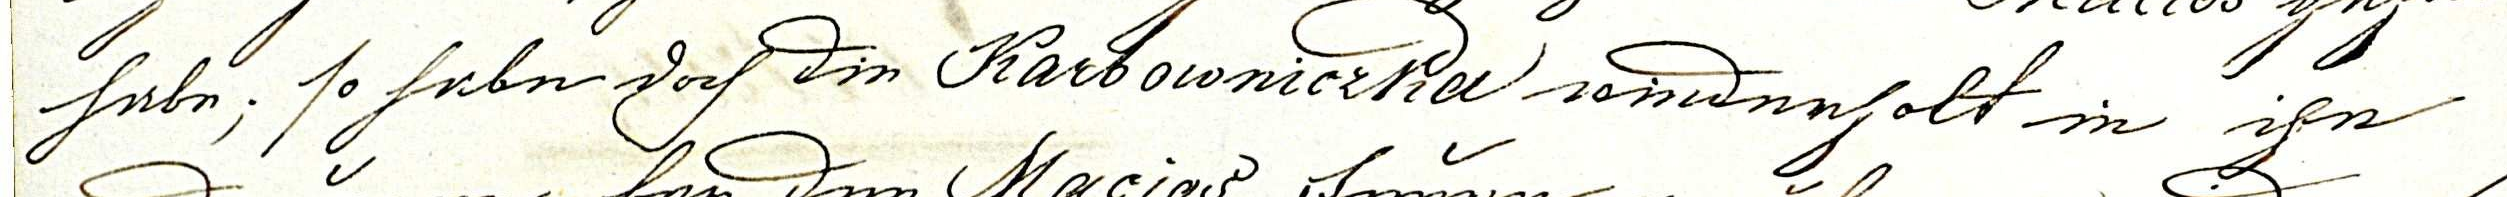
habe, so habe doch die Karbowniczka wiederholt in ihn
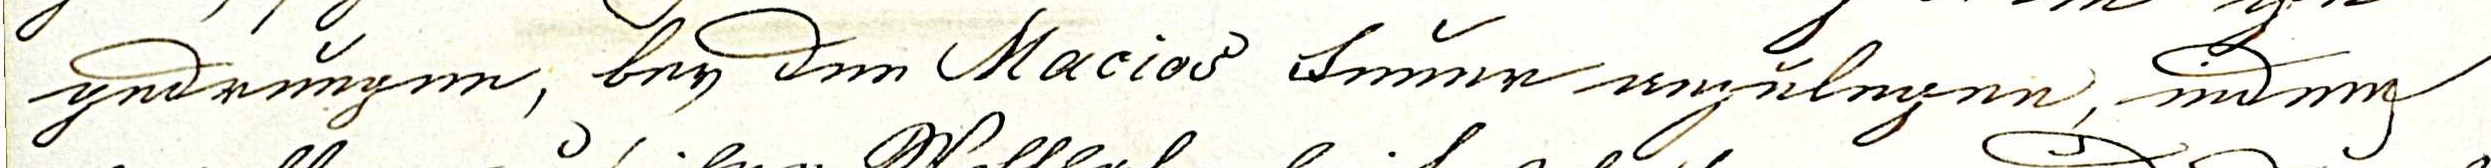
gedrungen, bey den Macios Feuer anzulegen, indem
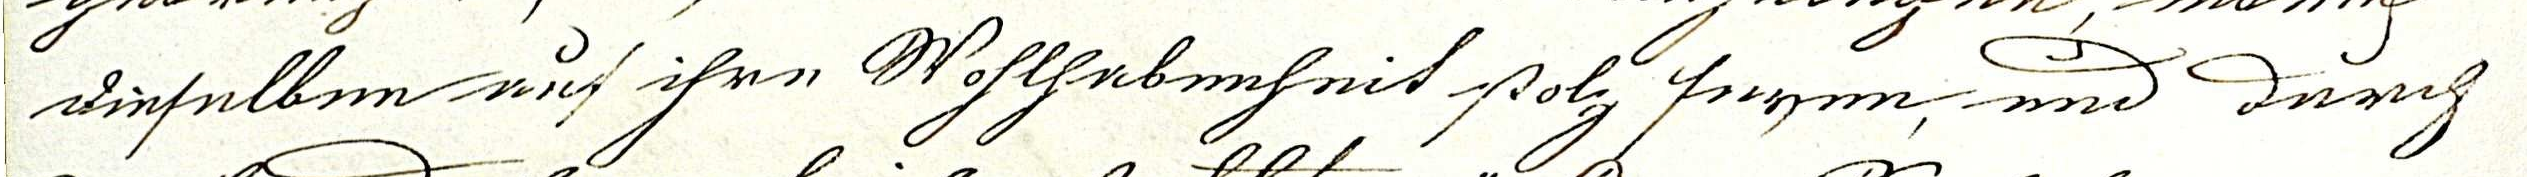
dieselben auf ihre Wohlhabenheit stolz seyen, und durch
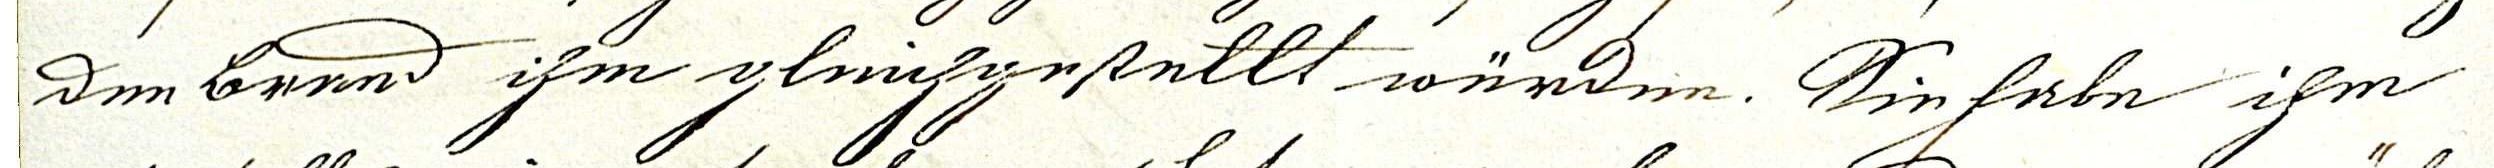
den Brand ihm gleichgestellt würden. Sie habe ihm
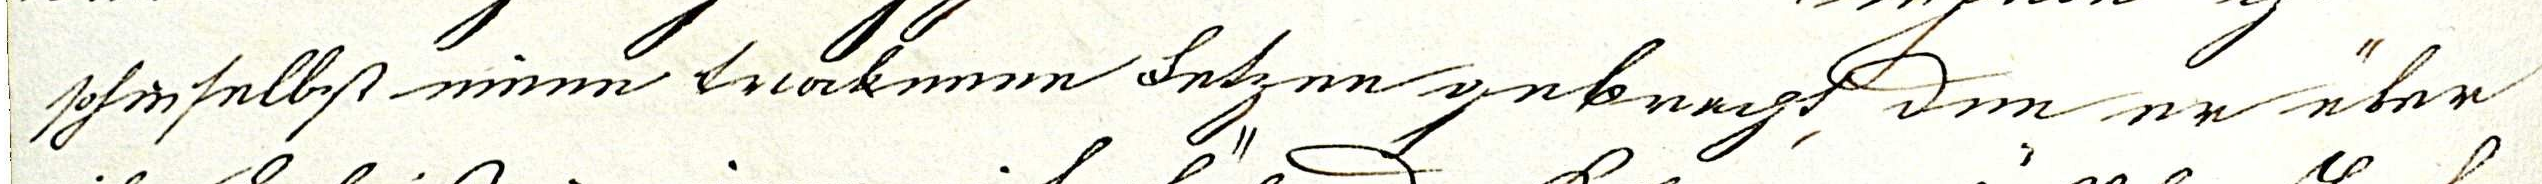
sohin selbst einen trockenen Fetzen gebracht, den er über
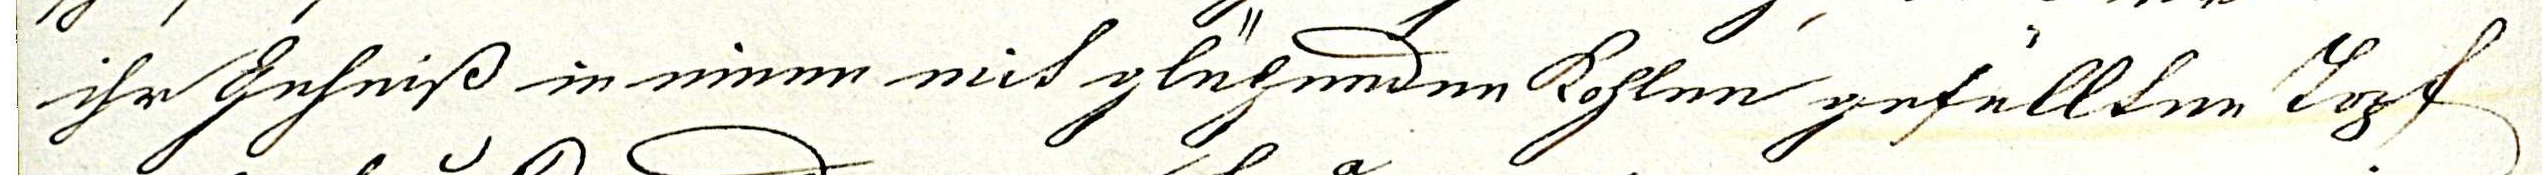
ihr Geheiß in einer mit glühenden Kohlen gefüllten Topf
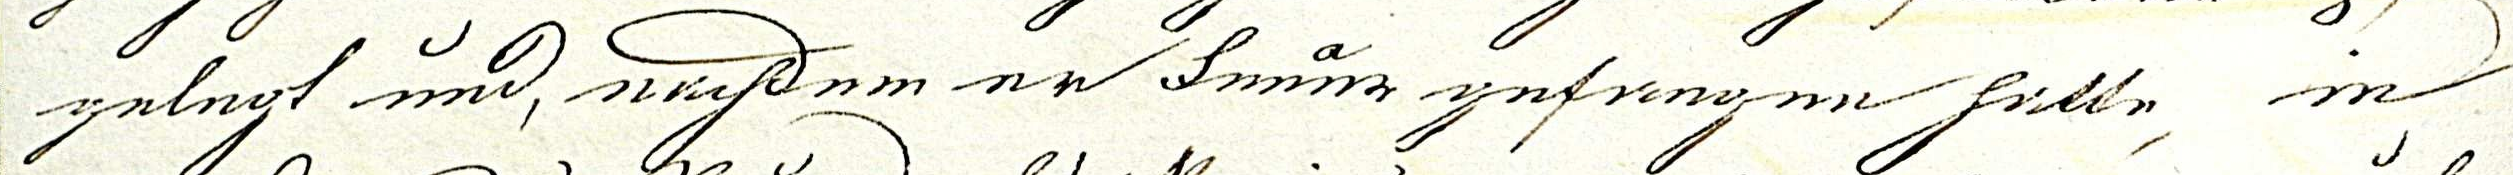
gelegt und, nachdem er Feuer gefangen hatte, in
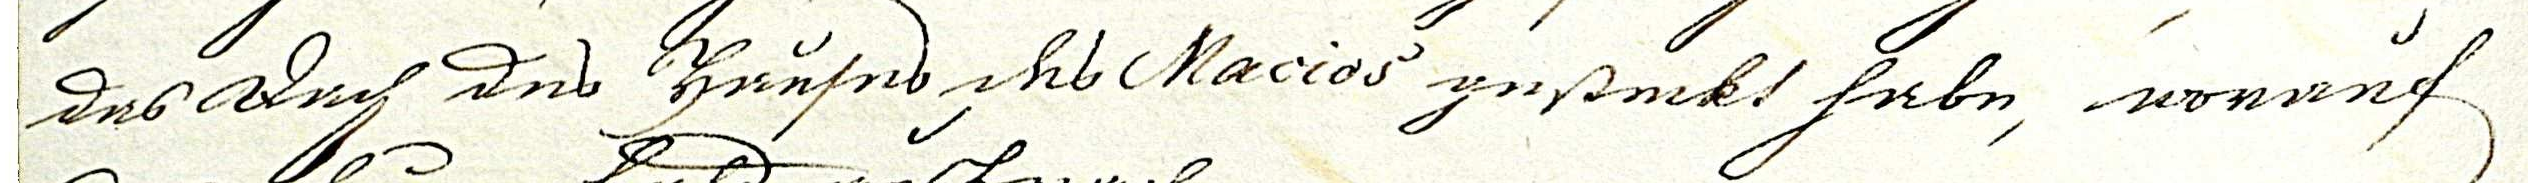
das Dach des Hauses des Macios gesteckt habe worauf
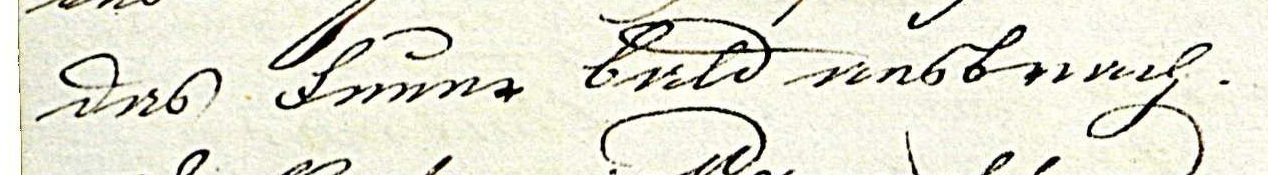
das Feuer bald ausbrach.
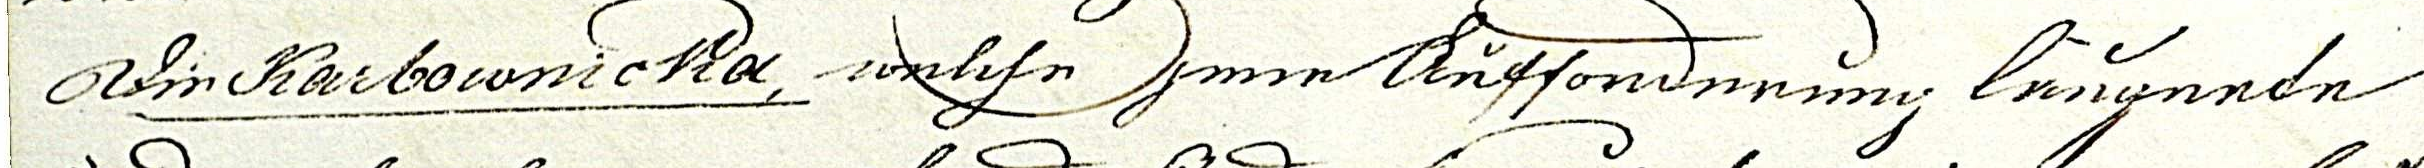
Die Karbownicka, welche jener Aufforderung läugnete
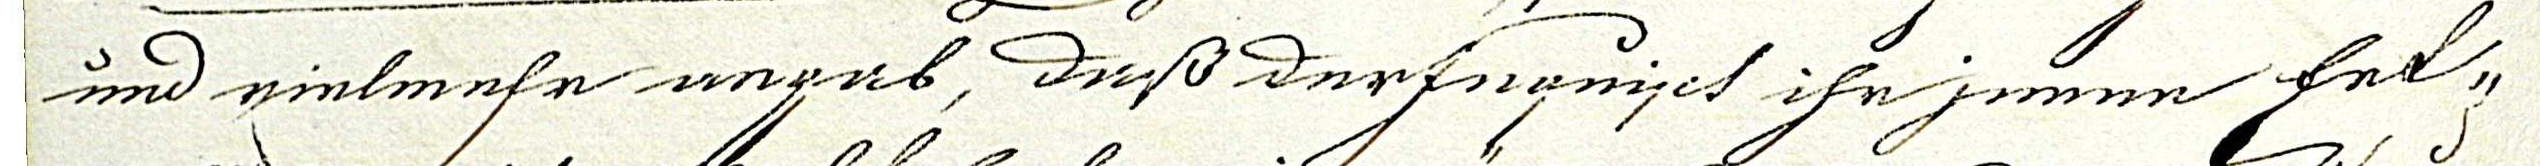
und vielmehr angab, daß der Inquisit ihr jenen Ent¬
